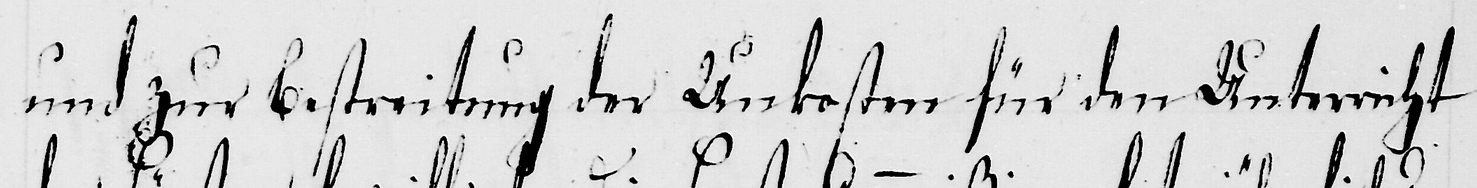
und zur Bestreitung der Unkosten für den Unterricht
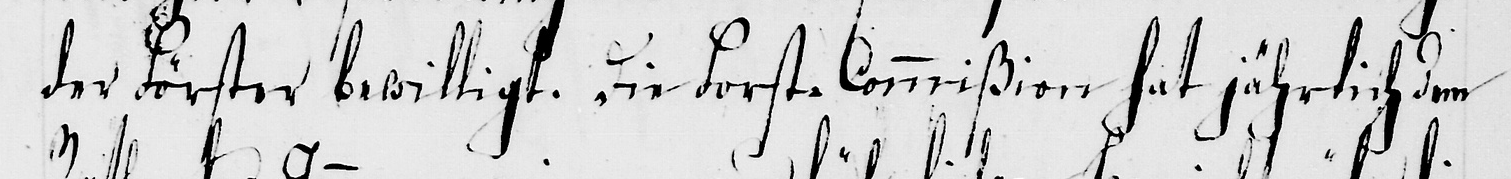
der Förster bewilligt. Die Forst-Commißion hat jährlich dem
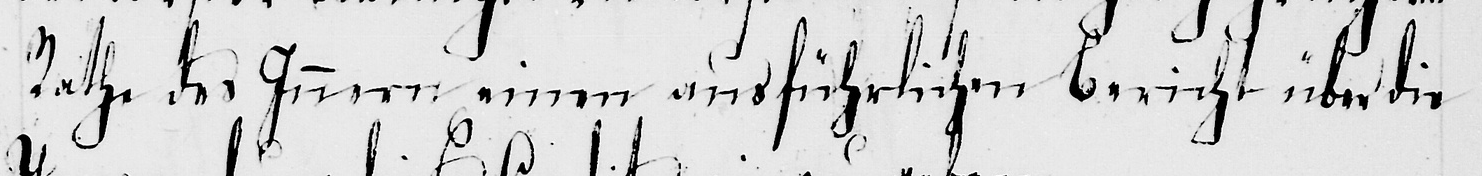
Rathe des Innern einen ausführlichen Bericht über die
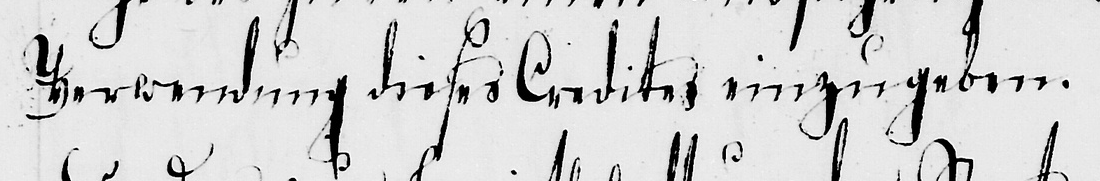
Verwendung dieses Credites einzugeben.
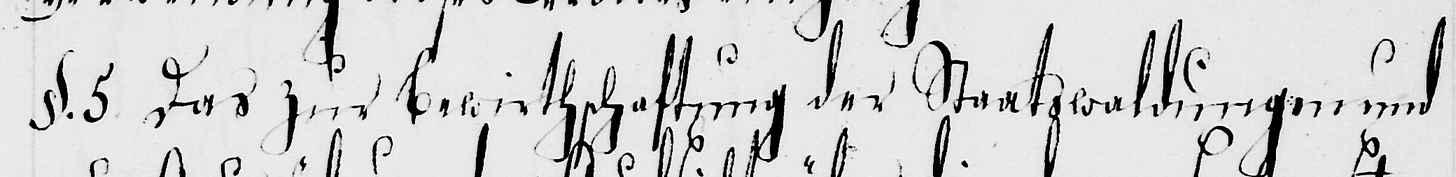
5. Das zur Bewirthschaftung der Staatswaldungen und
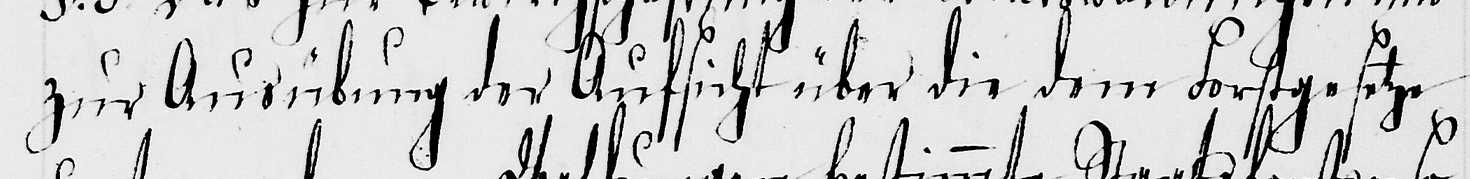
zur Ausübung der Aufsicht über die dem Forstgesetze
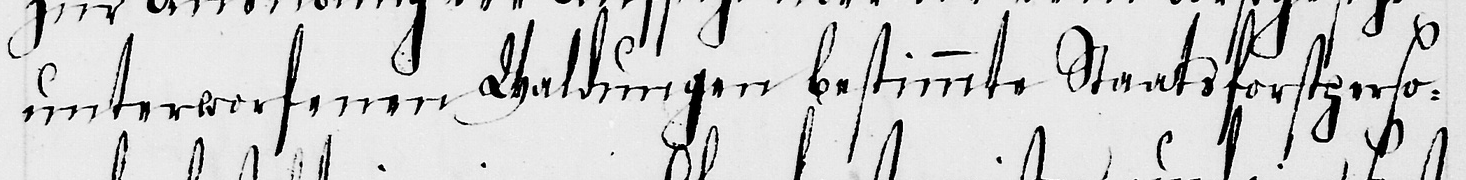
unterworfenen Waldungen bestimmte Staatsforstperso¬
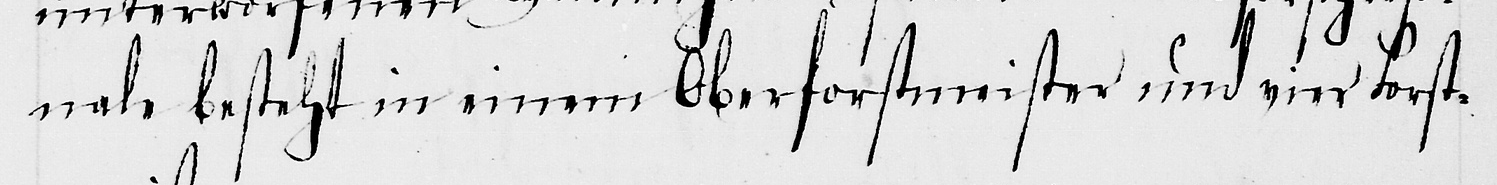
nale besteht in einem Oberforstmeister und vier Forst¬
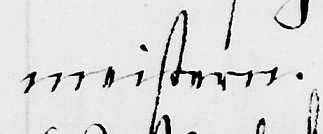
meistern.
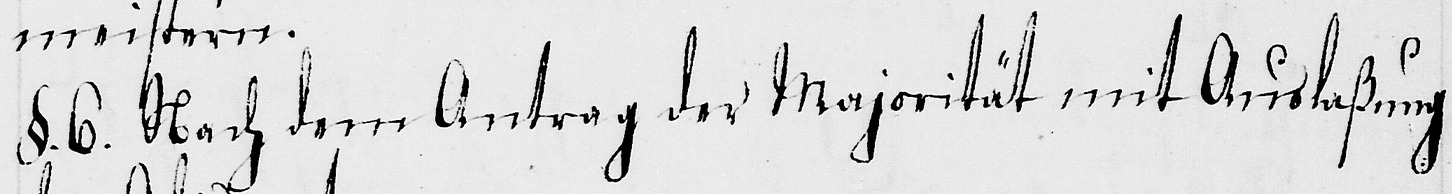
§. 6. Nach dem Antrag der Majorität mit Auslaßung
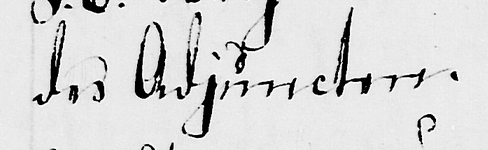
des Adjuncten.
